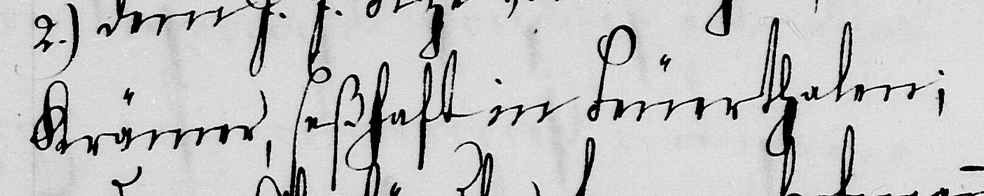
Krämer, seßhaft in Feuerthalen;
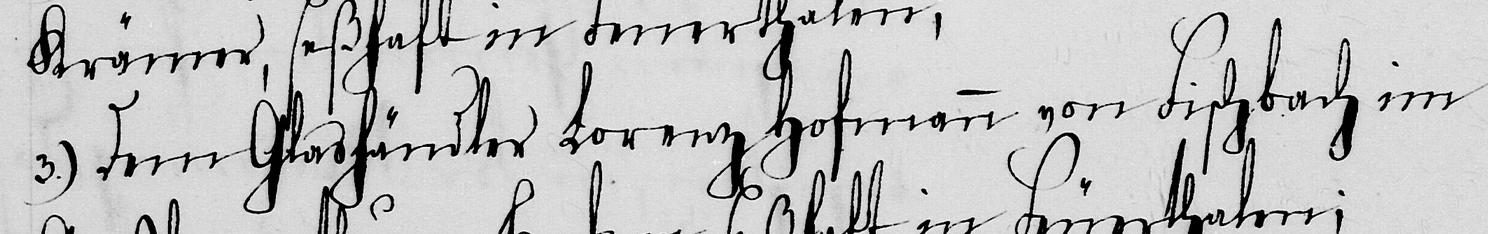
3.) Dem Glashändler Lorenz Hofmann von Fischbach im
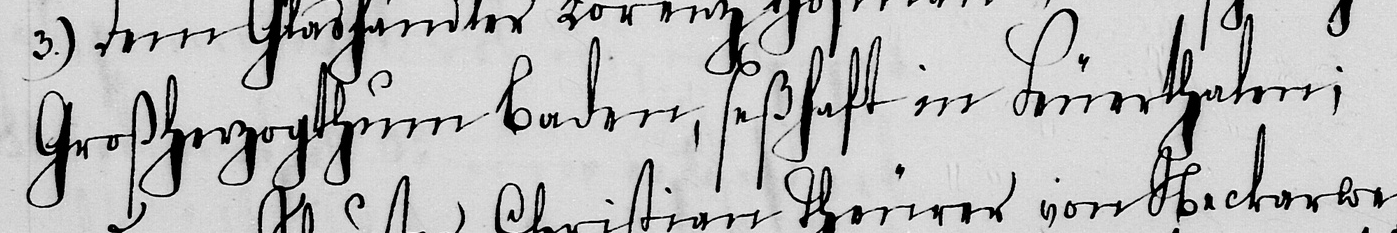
Großherzogthum Baden, seßhaft in Feuerthalen;
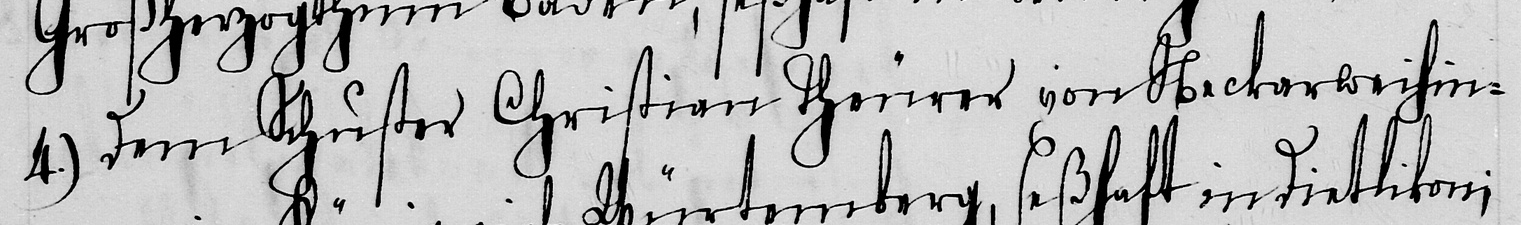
4.) Dem Schuster Christian Theurer von Neckarweihin¬
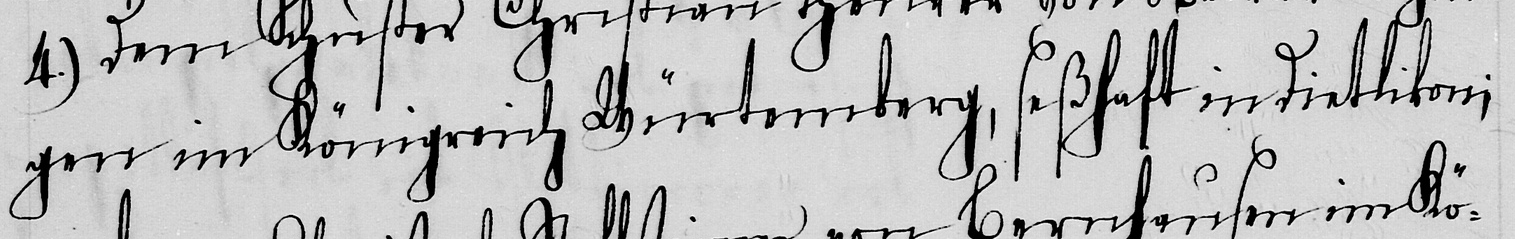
gen im Königreich Würtemberg, seßhaft in Dietikon;
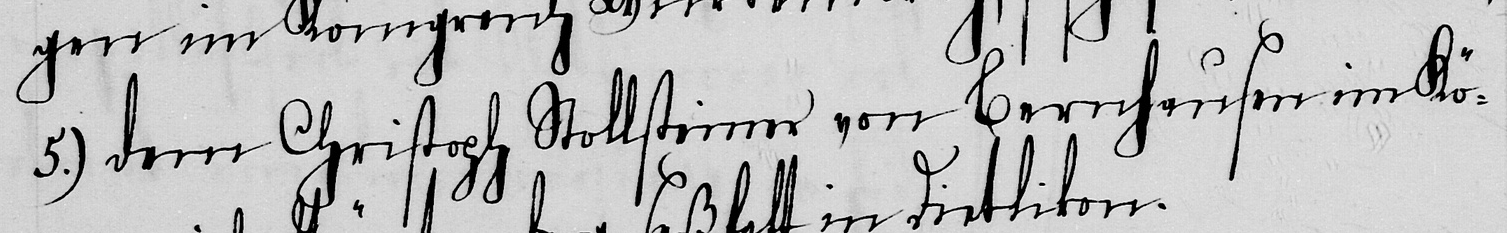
5.) dem Christoph Stollsteiner von Bernhausen im Kö¬
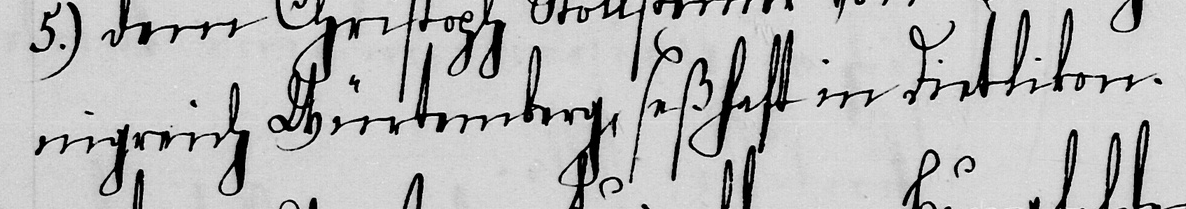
nigreich Würtemberg, seßhaft in Dietlikon.
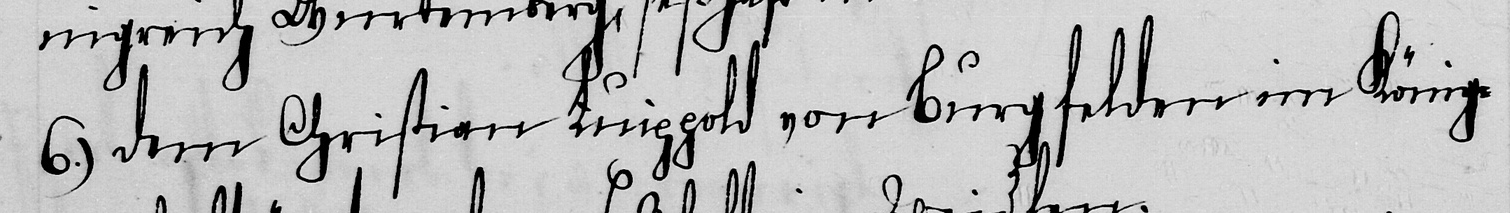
6.) dem Christian Luippold von Burgfelden im König¬
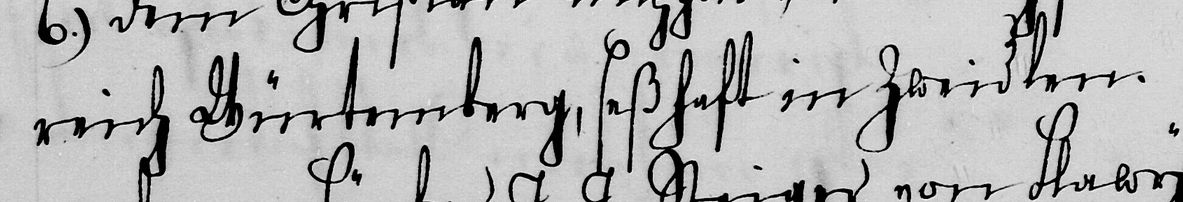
reich Würtemberg, seßhaft in Zweidlen.
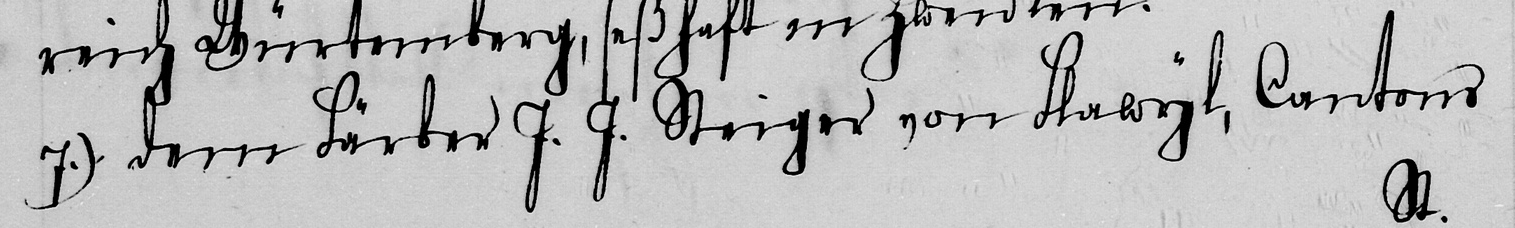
7.) dem Färber J. J. Steiger von Flawyl, Cantons
